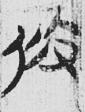攸（修）
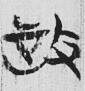政
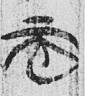而
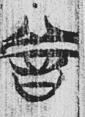善
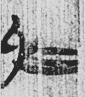於
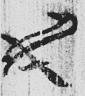民
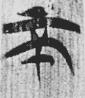不
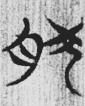○（然）
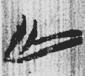亡
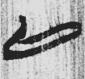㠯
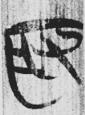取
